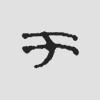于
